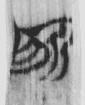所
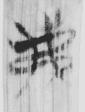弗
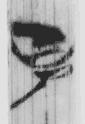克
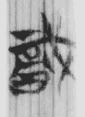戠
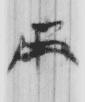甬
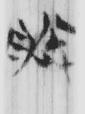朕
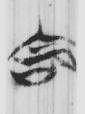命
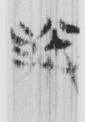朕
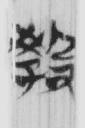教
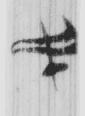民
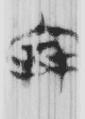朋
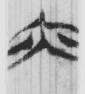亦
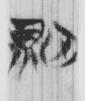則
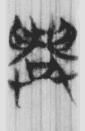興
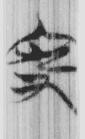{宀九又}
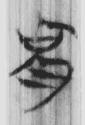肙
